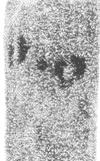厀（漆）
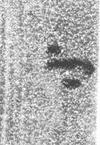屯
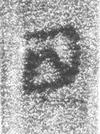四
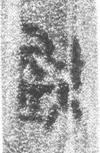鈇（鋪）
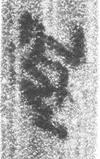首
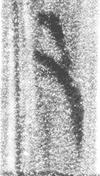又（有）
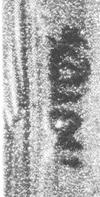鐶（環）
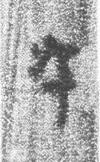竹
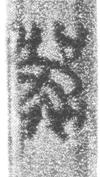器
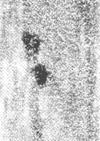十
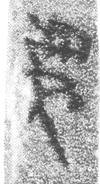○（簠）
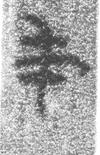屯
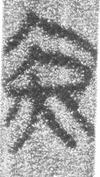赤
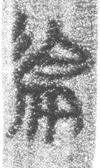綿（縵）
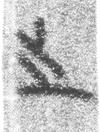之
